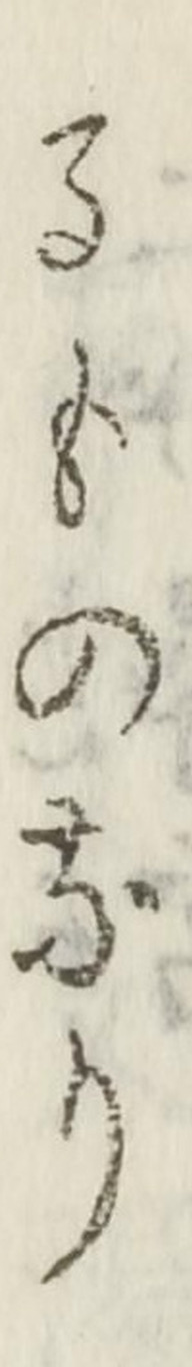るものなり
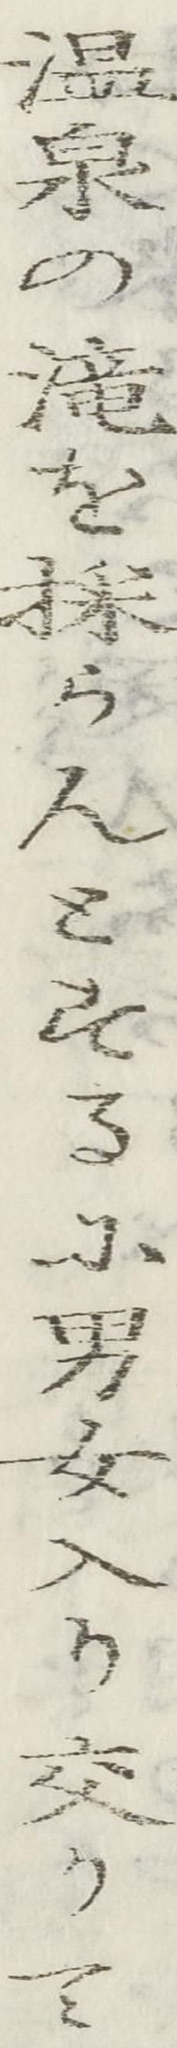温泉の滝を採らんとするに男女入り交りて
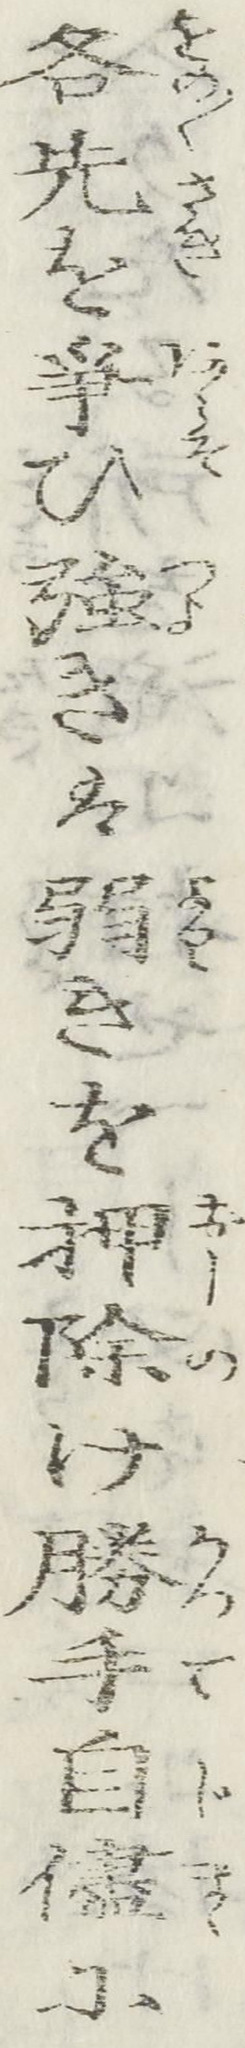各先を争ひ強きは弱きを押除け勝手自儘に
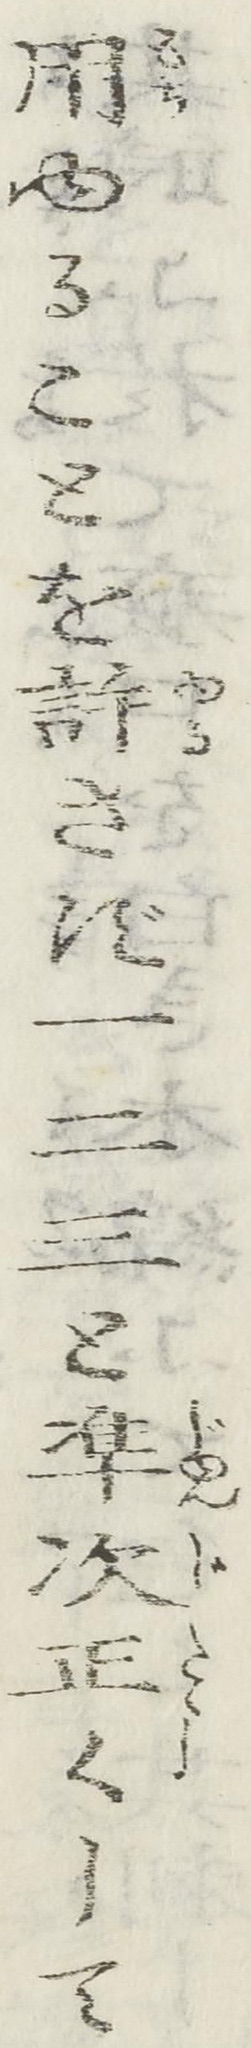用ゆることを許さず一二三と準次正くして
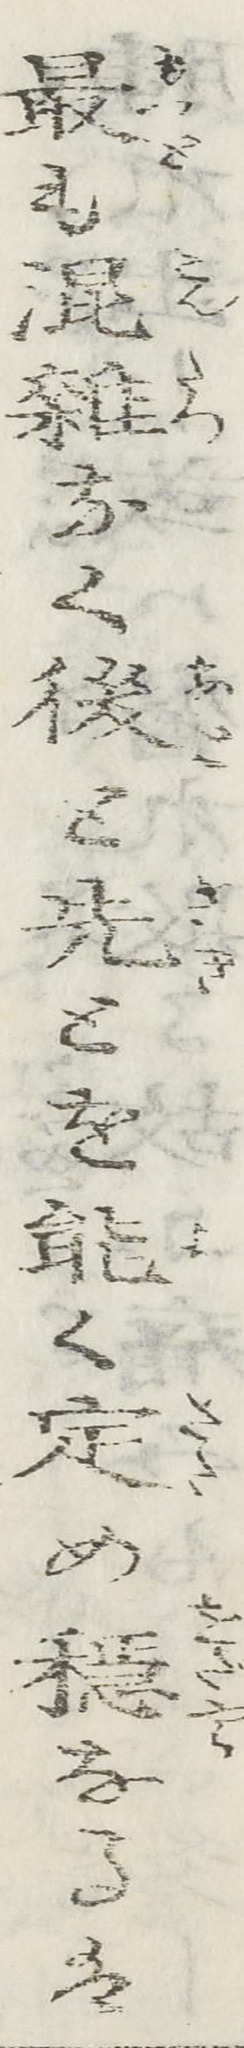最も混雑なく後と先とを能く定め穏なるは
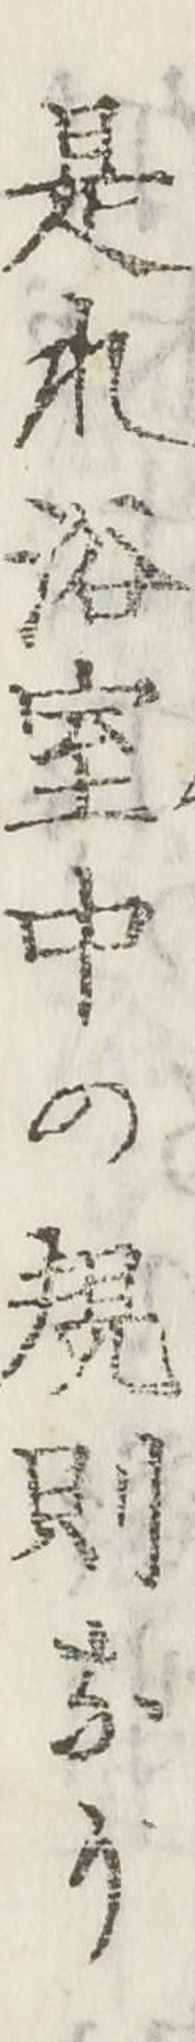是れ浴室中の規則なり

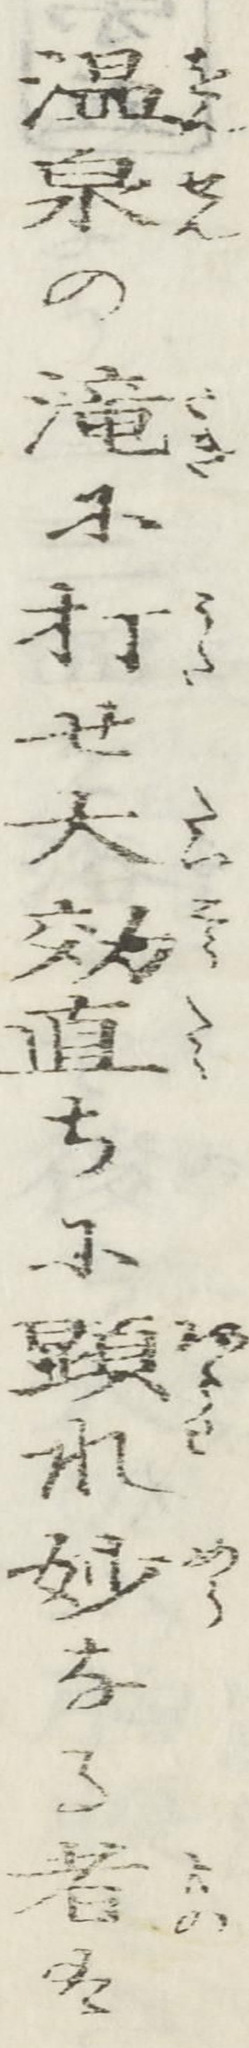温泉の滝に打せ大効直ちに顕れ妙なる者は
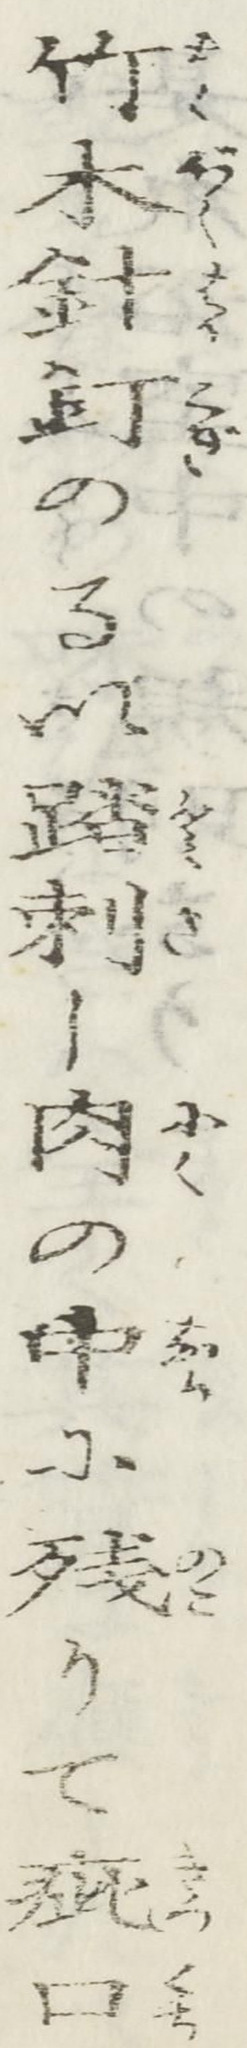竹木針釘のるい踏刺し肉の中に残りて疵口
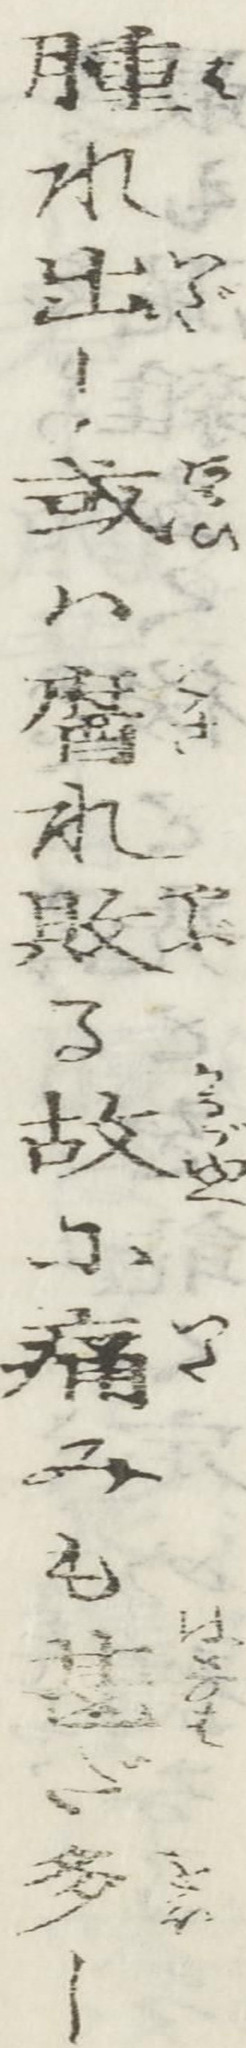腫れ出し或は腐れ敗る故に痛みも甚だ多し
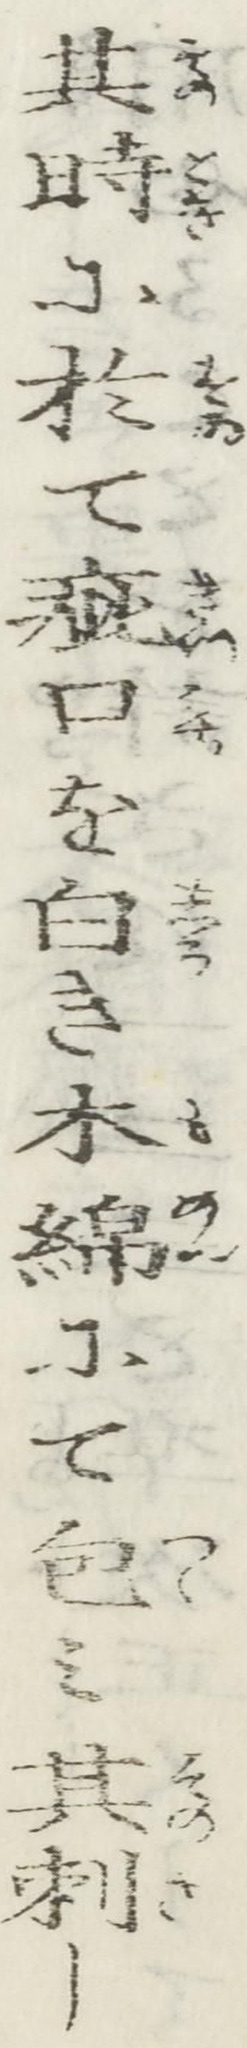其時に於て疵口を白き木綿にて包み其刺し
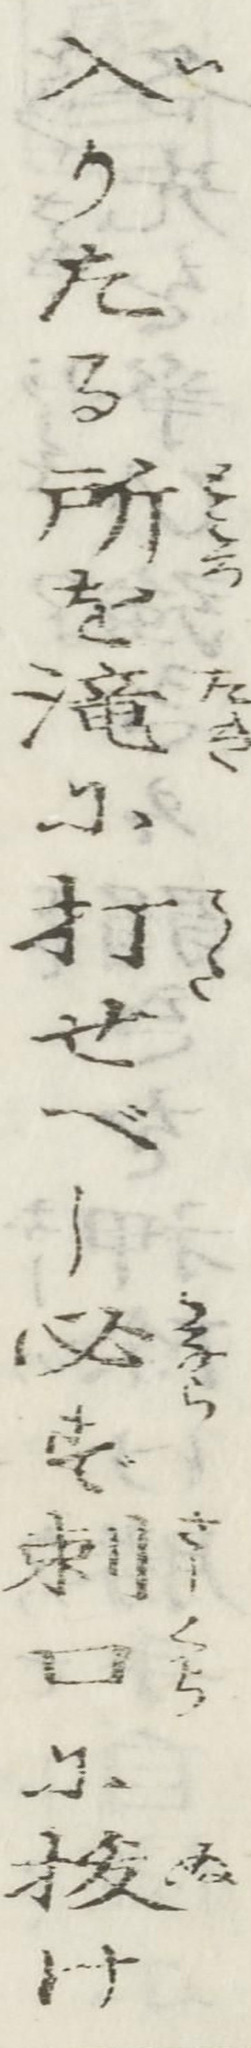入りたる所を滝に打せべし必ず刺口に抜け
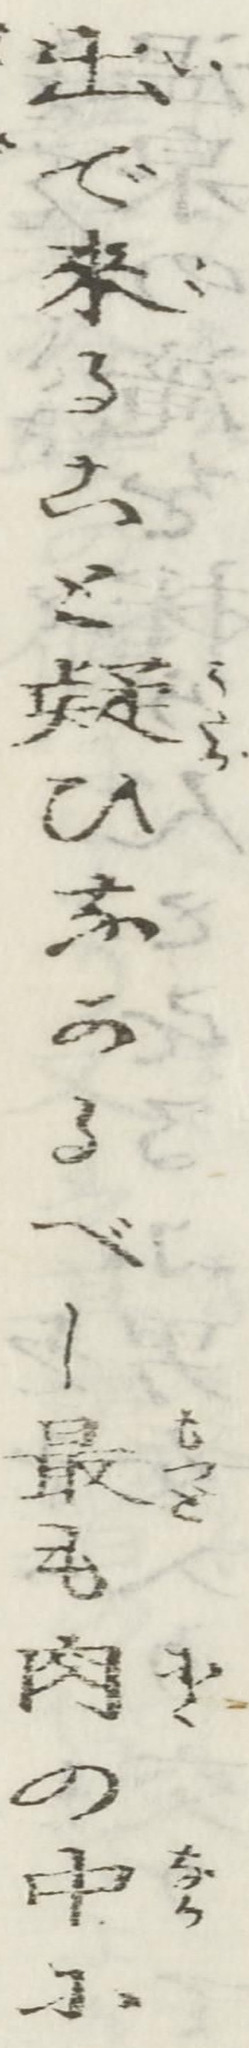出で来ること疑ひなかるべし最も肉の中に
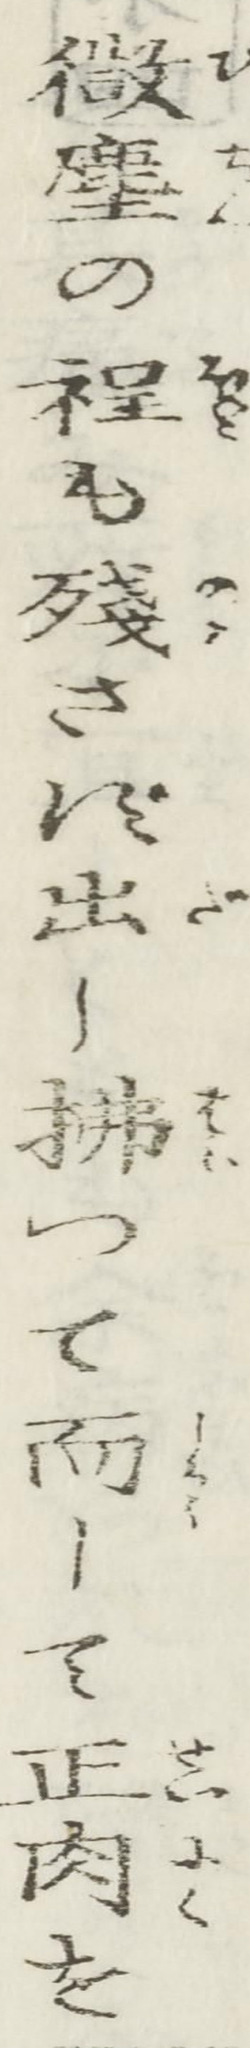微塵の程も残さず出し払つて而して正肉を
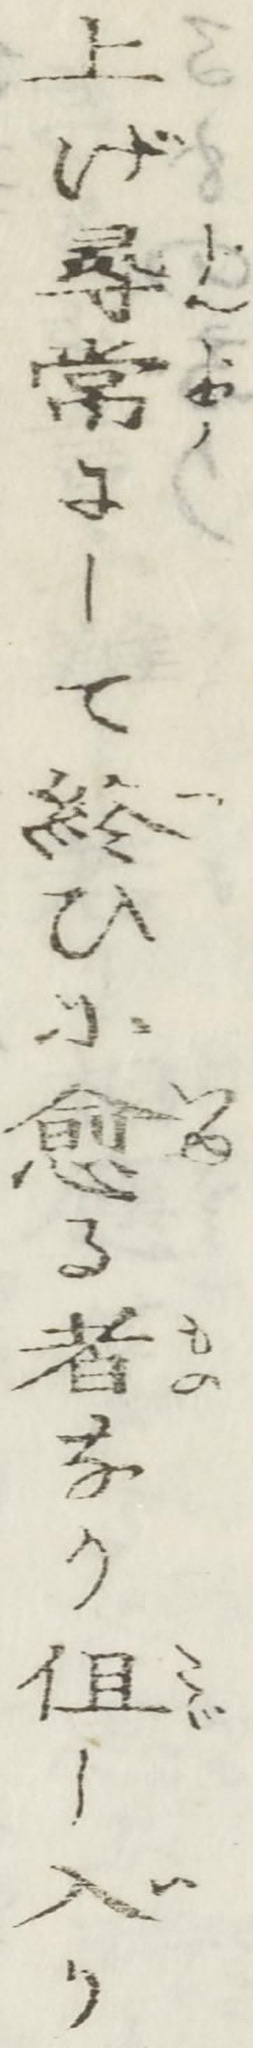上げ尋常にして終ひに愈る？者なり但し入り
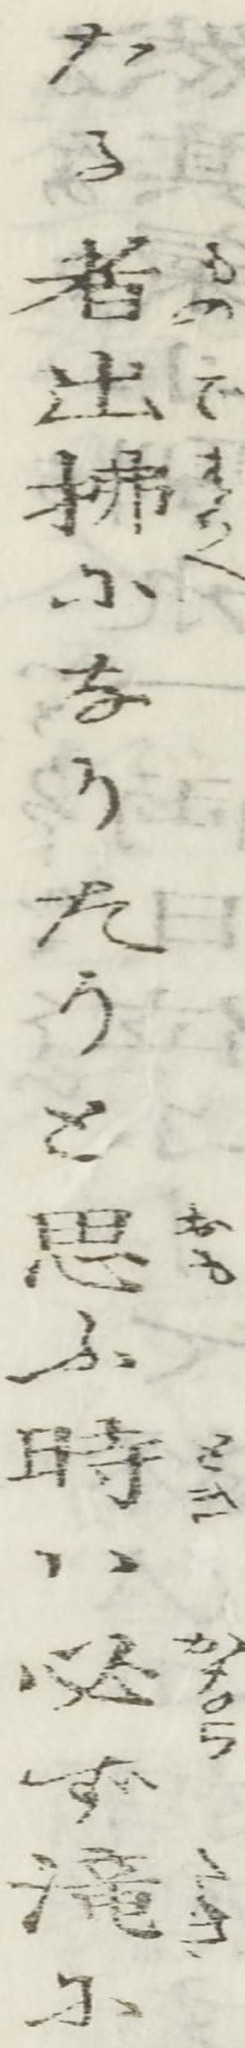たる者出払ふなりたりと思ふ時は必ず滝に
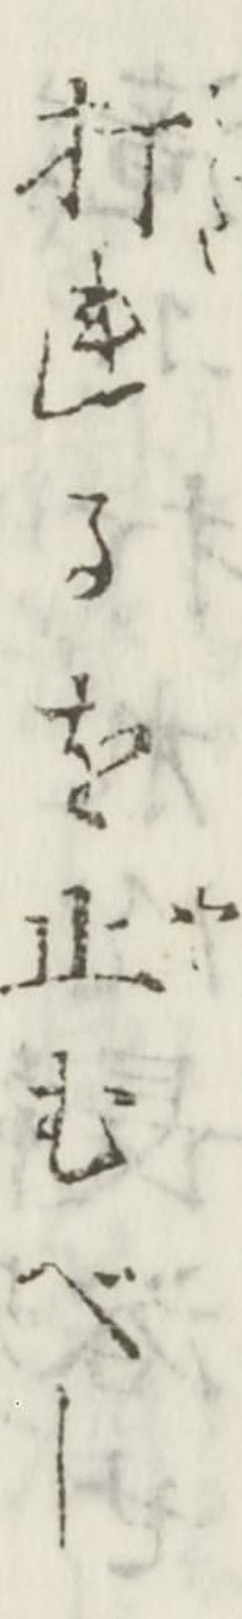打れるを止むべし
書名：鎌先温泉由來記
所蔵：東京大学地震研究所図書室 Earthquake Research Institute Library, The University of Tokyo, JAPAN
